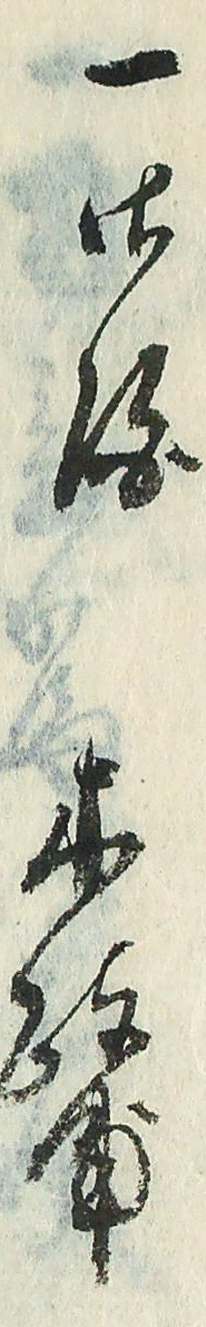一御泊木岐浦
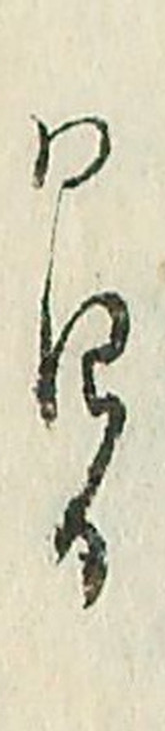同四日
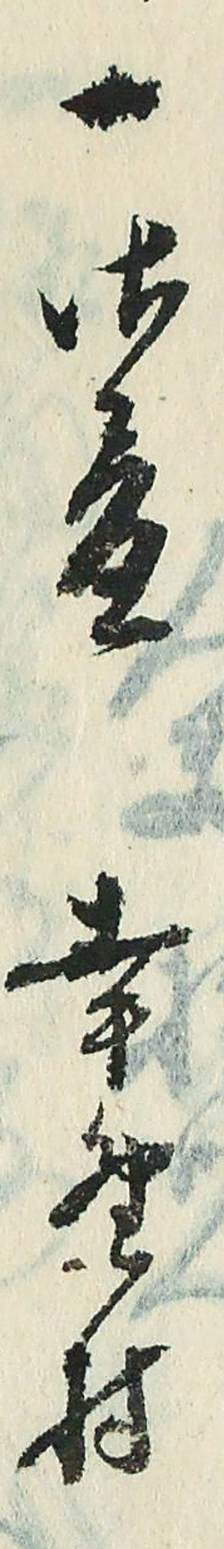一御昼桑野村
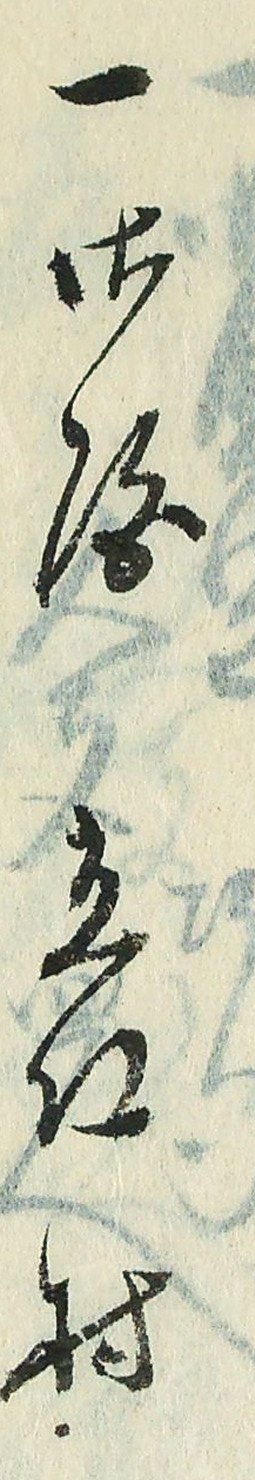一御泊立江村
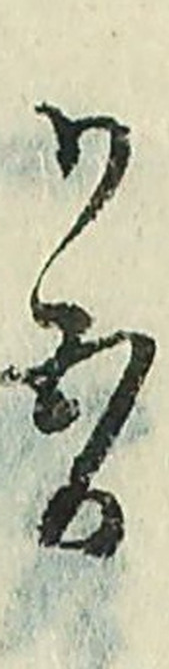同五日
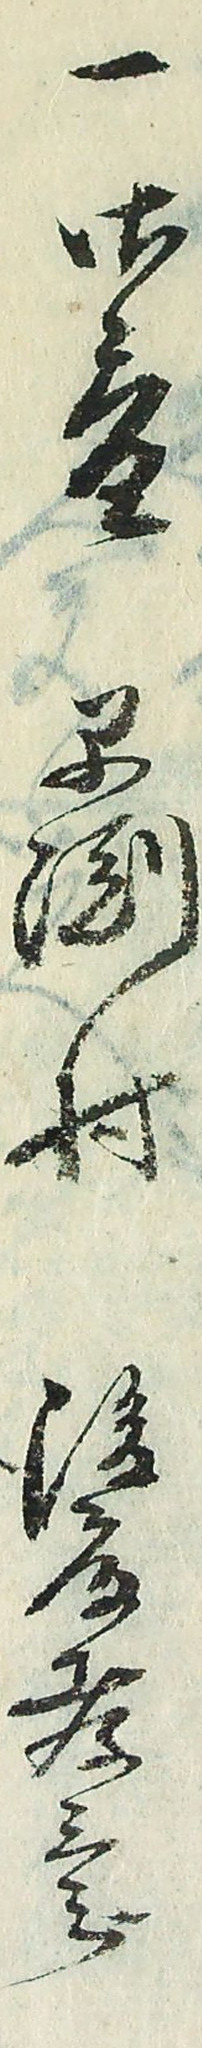一御昼早淵村後藤孝三郎
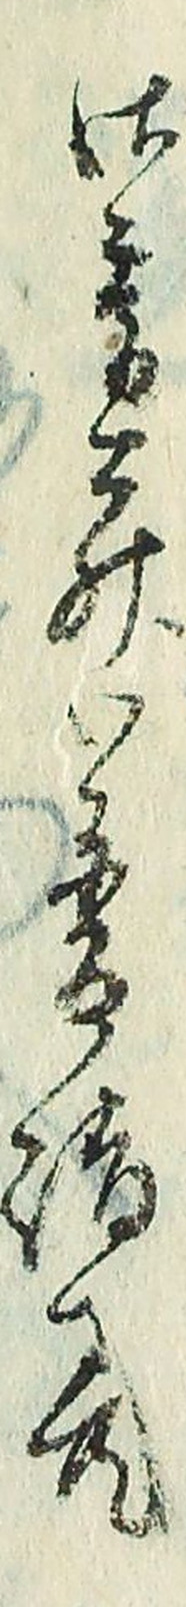御二方并御普請方共
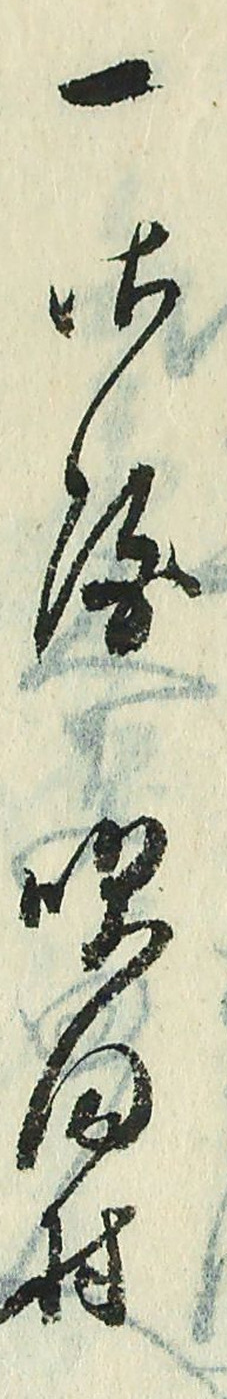一御泊吹田村
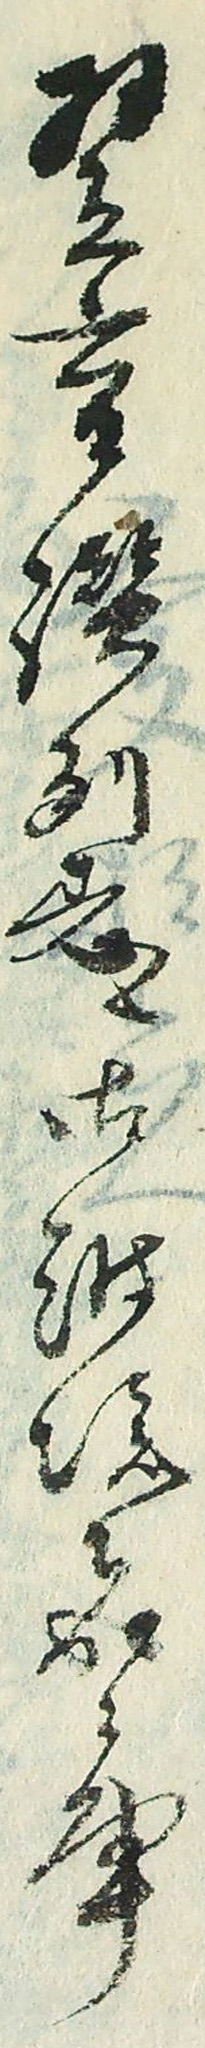翌六日讃州表へ御越境被成候事
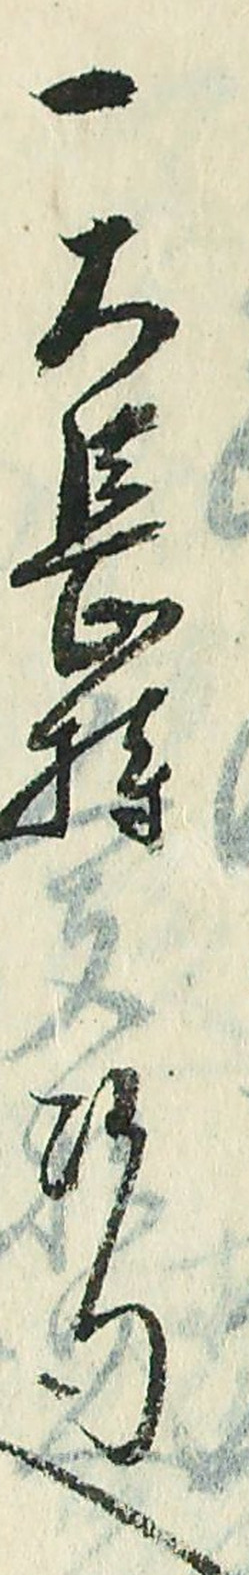一大長持弐つ
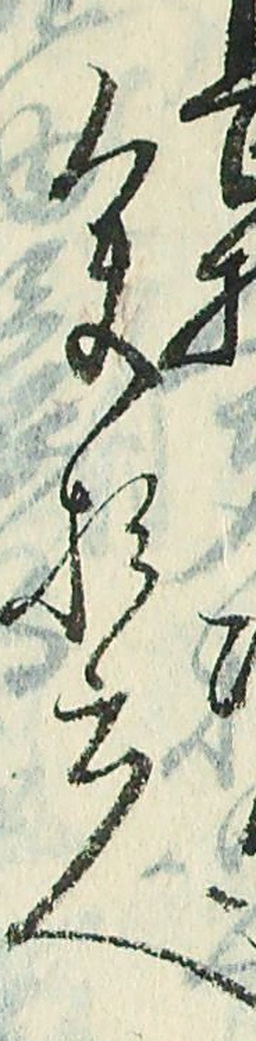人夫拾六人
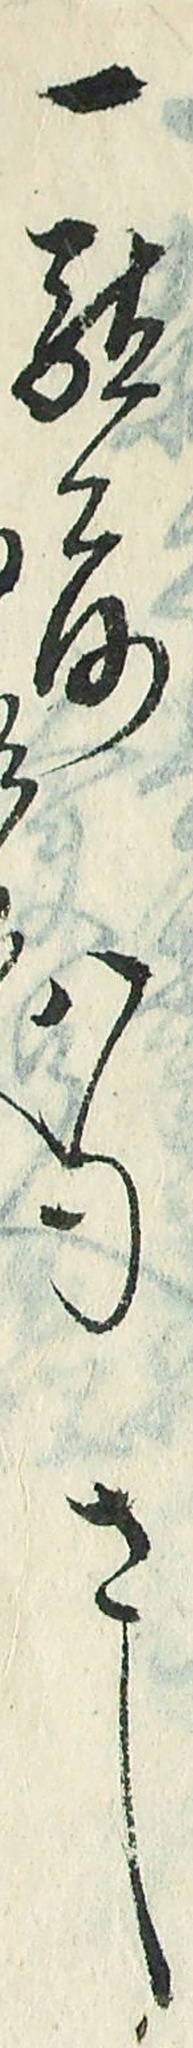一駄荷八つさし
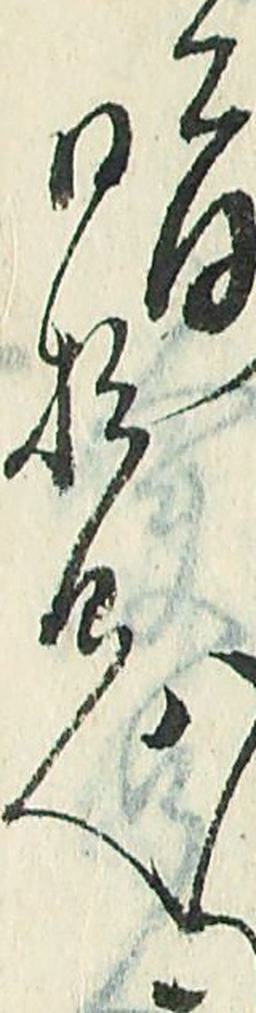同拾四人

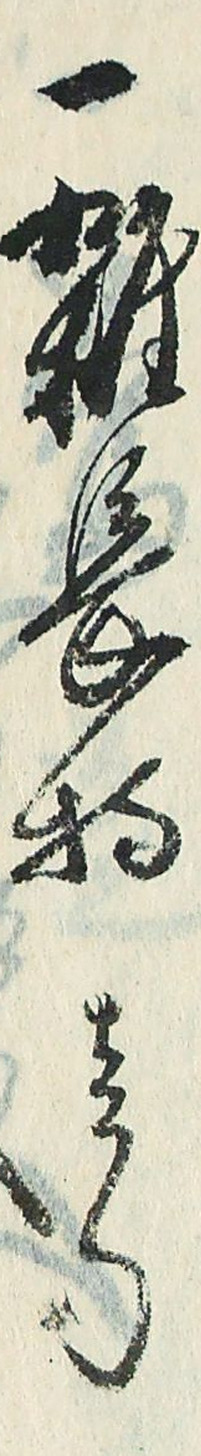一雑長持壱つ
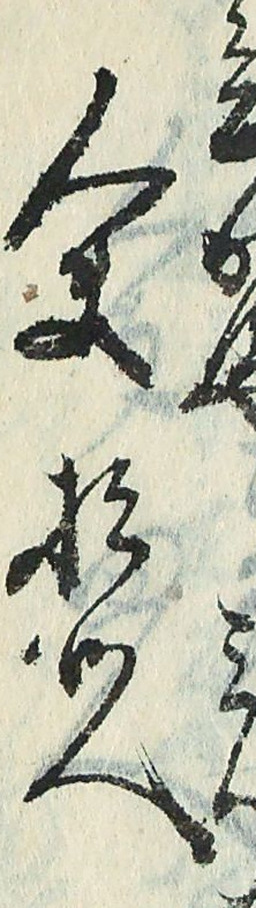人夫拾弐人
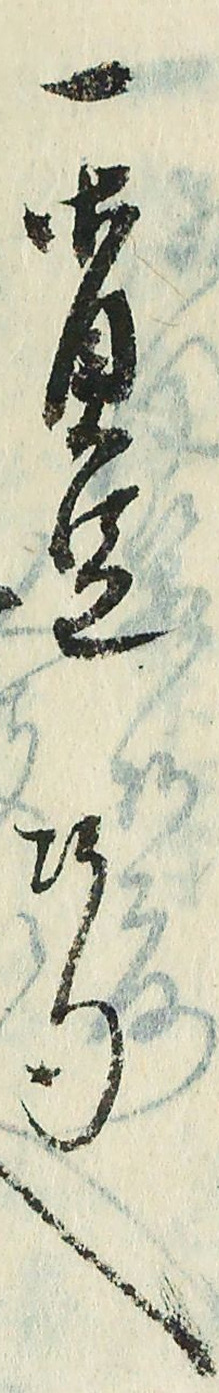一御具足弐つ
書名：公辺御役人為御廻浦御立越諸御用一巻
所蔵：鳴門教育大学 Naruto University of Education
